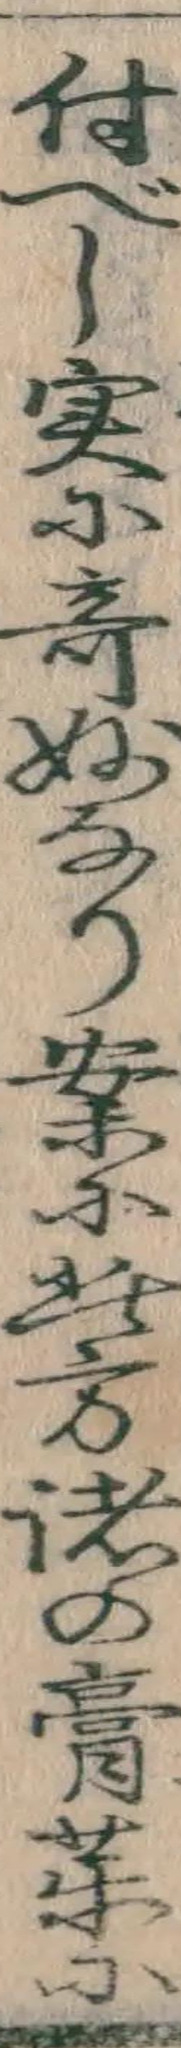付べし実に奇妙なり案に此方諸の膏薬に
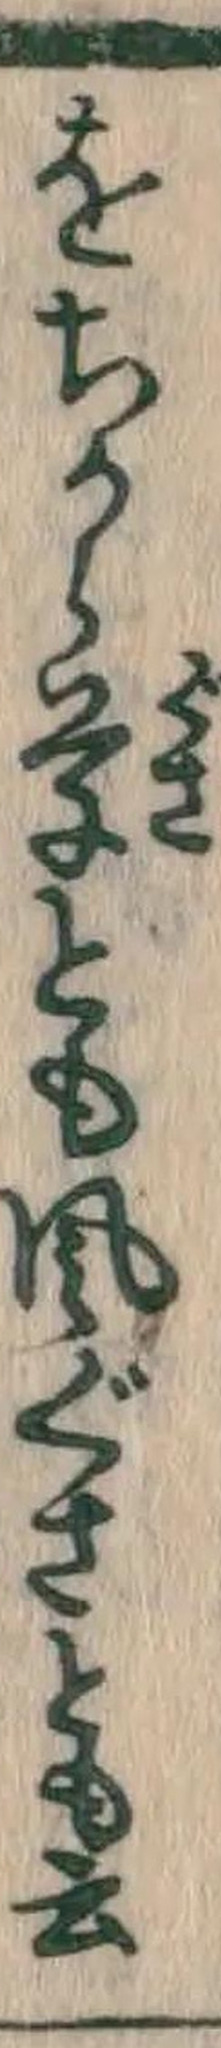をちから草とも風ぐさとも云
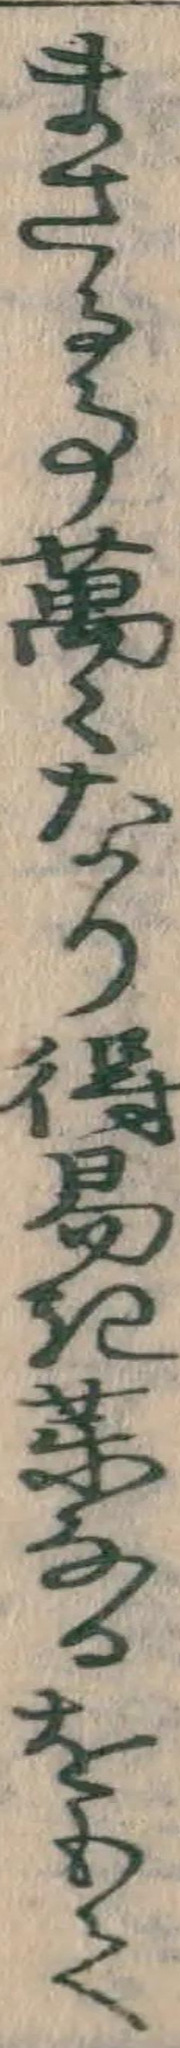まさる事万々なり得易き薬なるをもて
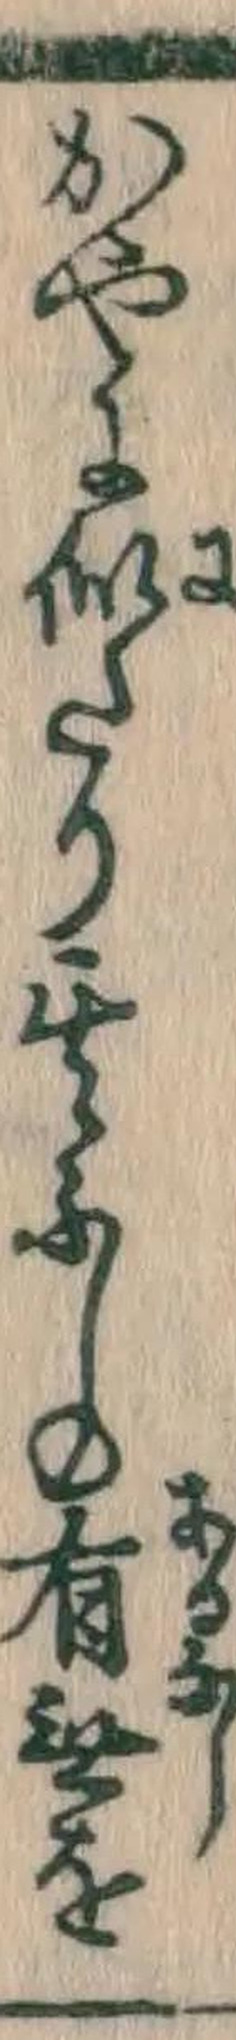かやに似たり其ふしの有無を
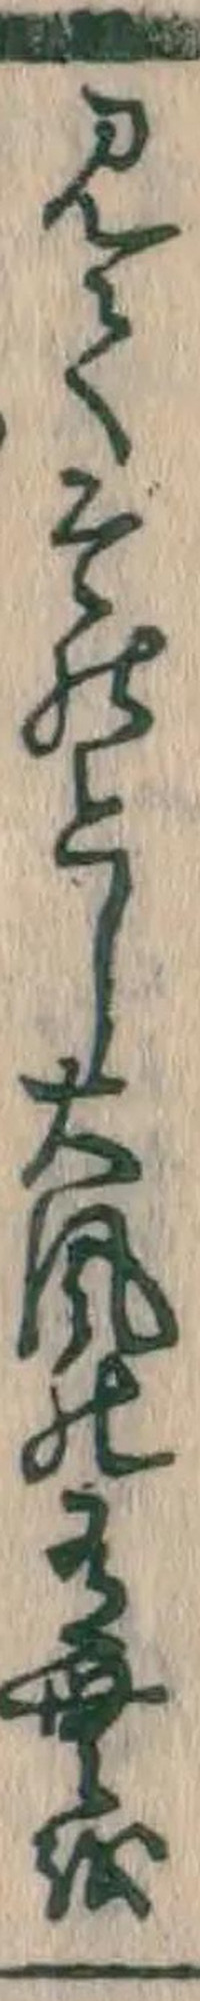見てそのとし大風の有無を
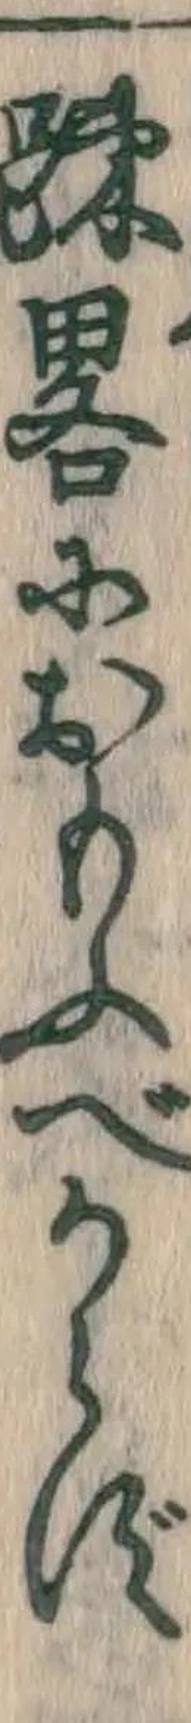疎略におもふべからず
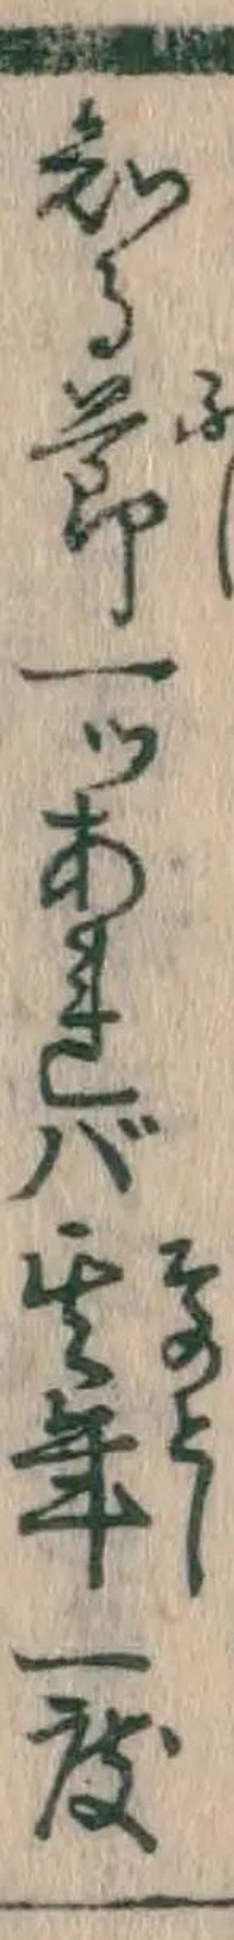知る節一ッあれば其年一度
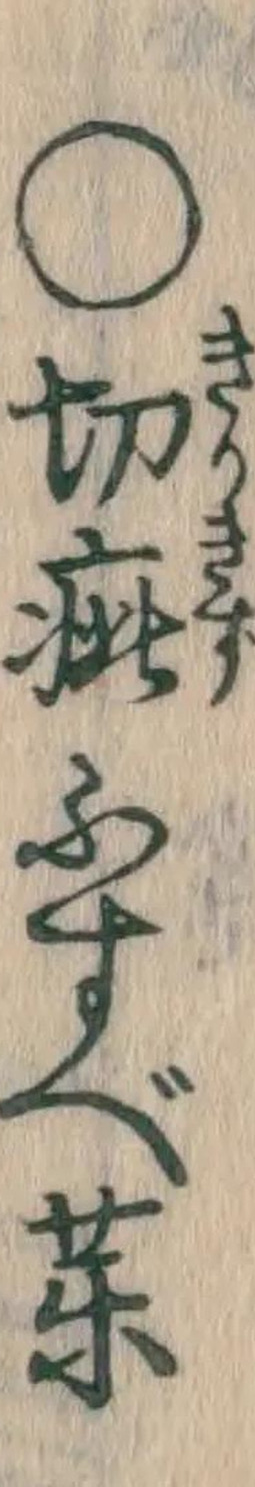○切疵ふすべ薬
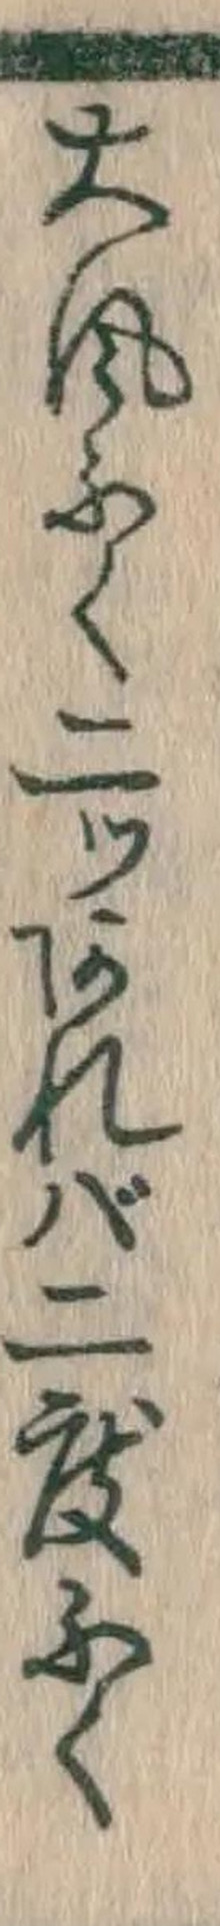大風ふく二ッあれば二度ふく
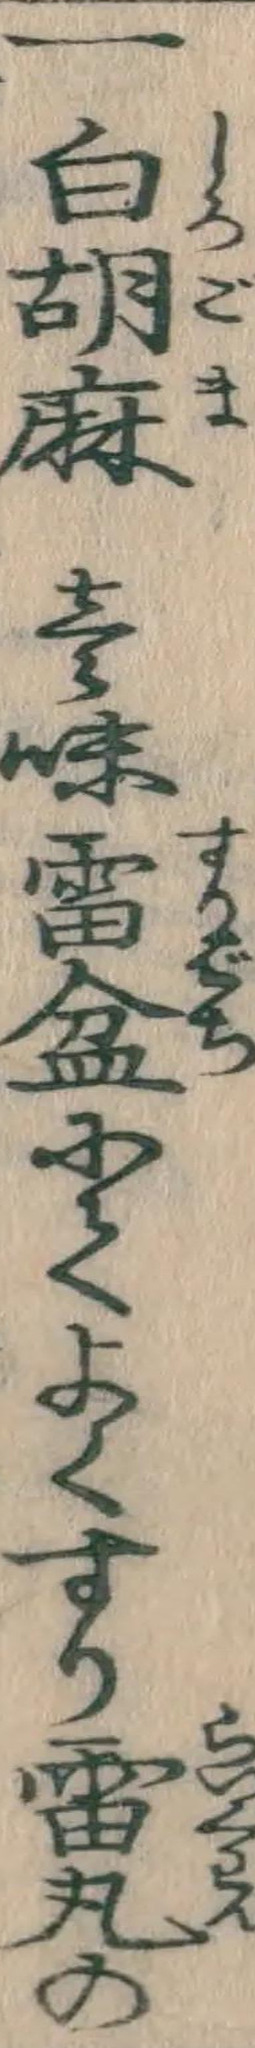一白胡麻壱味雷盆にてよくすり雷丸の
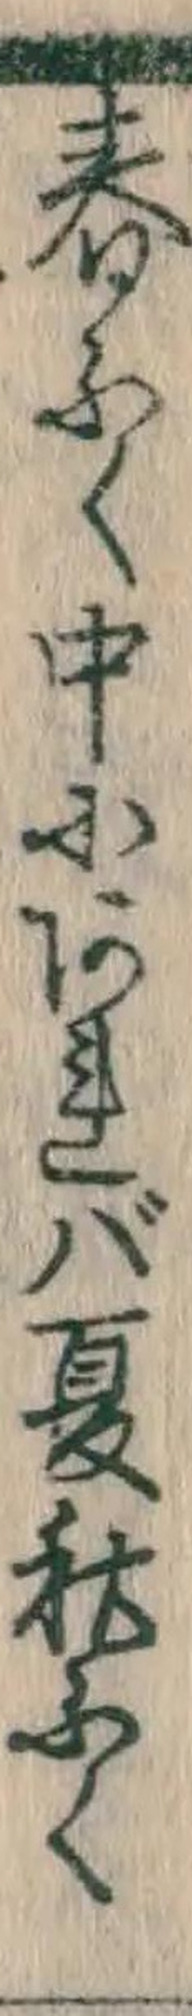春ふく中にあれば夏秋ふく
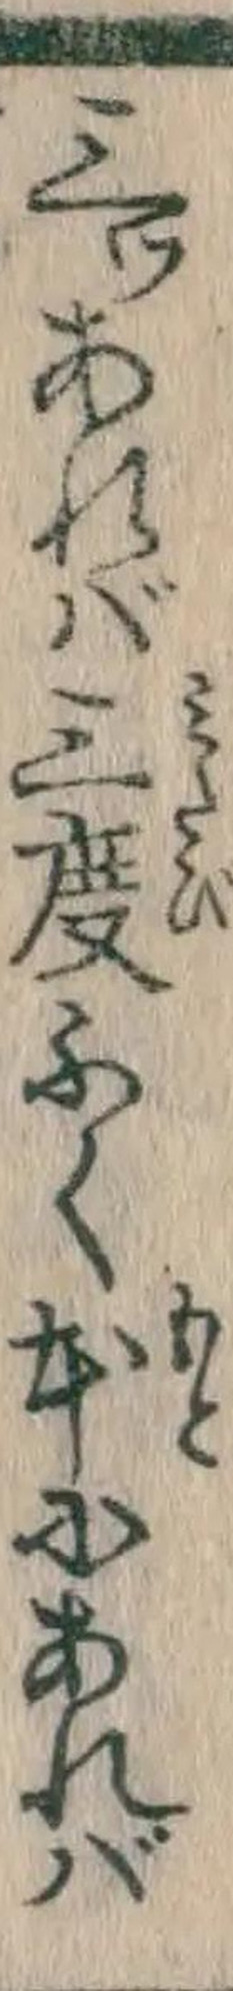三ッあれば三度ふく本にあれば
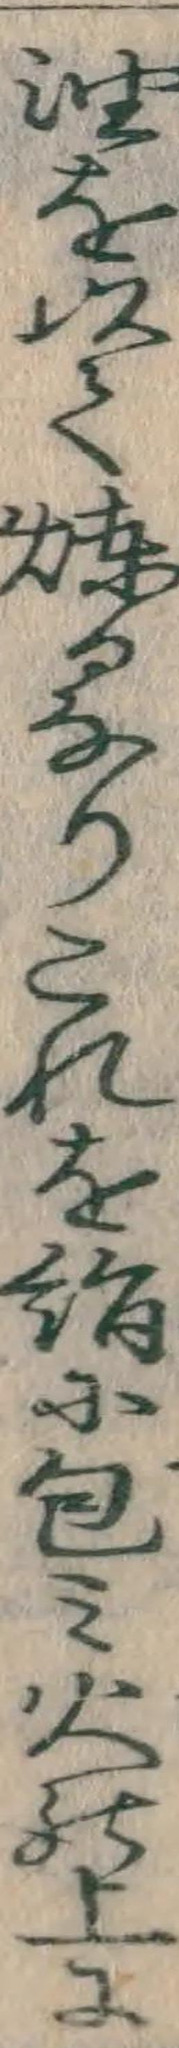油を以て煉るなりこれを絹に包み火の上に
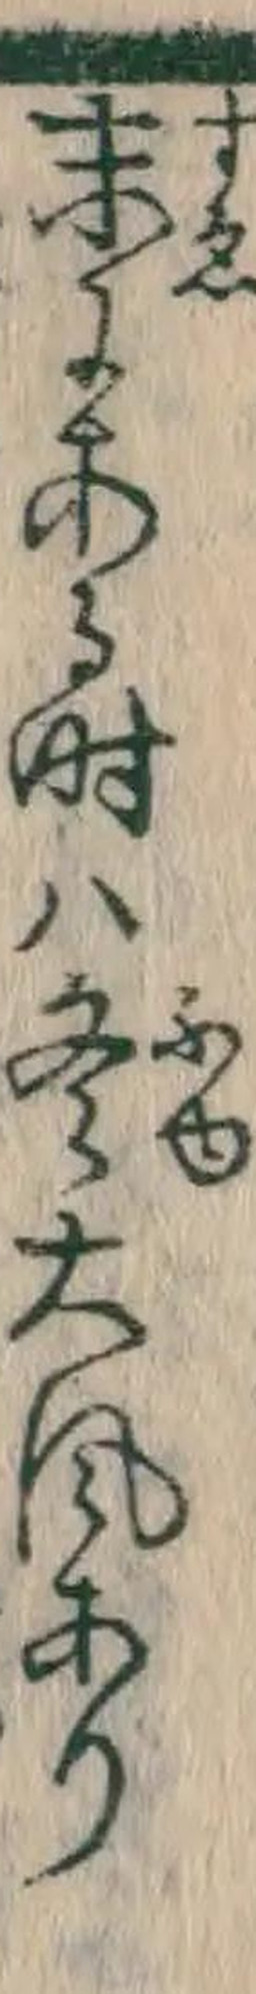末にある時は冬大風あり
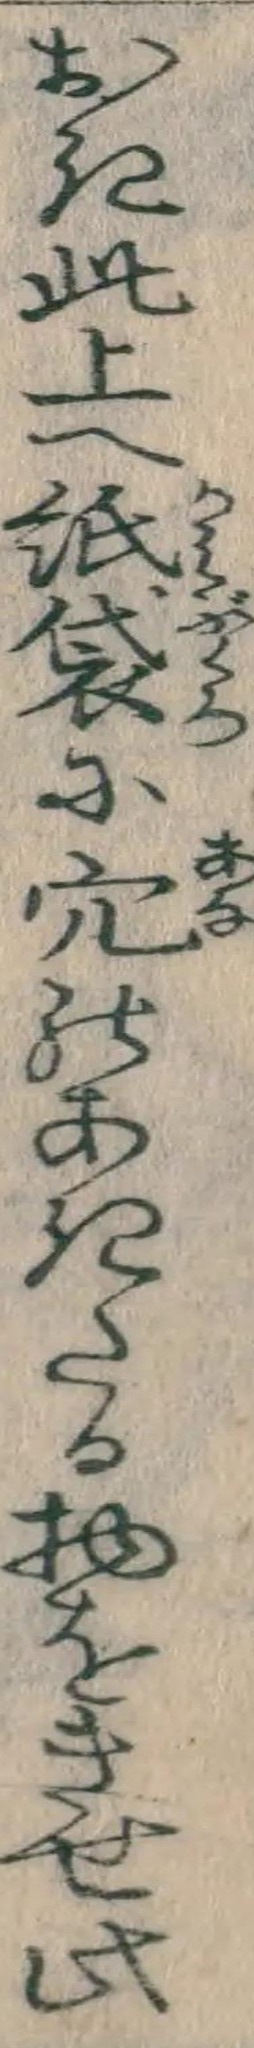おき此上へ紙袋に穴のあきたる物をきせ此
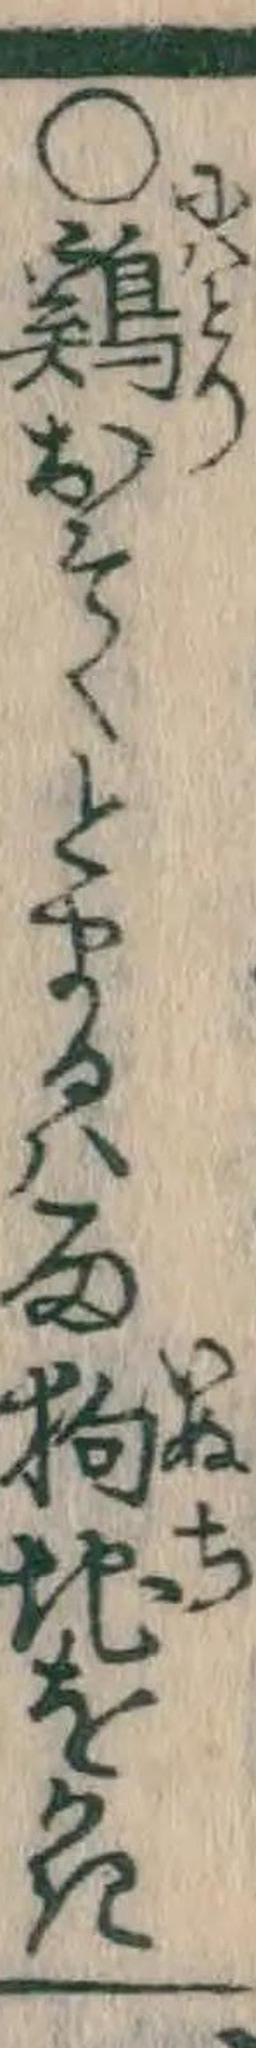○鶏おそくとまるは雨狗地をかき
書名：広益秘事大全 3巻. [4]
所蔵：国立国会図書館 National Diet Library, JAPAN
